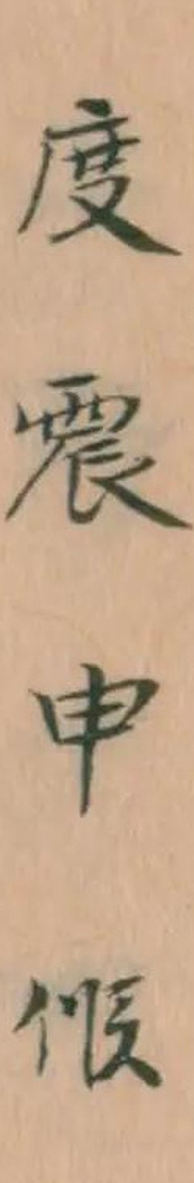度震申候
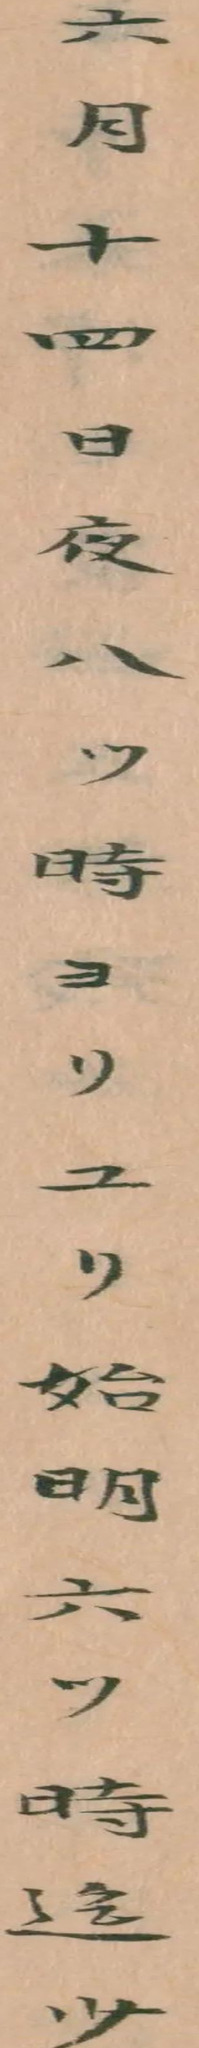六月十四日夜八ッ時ヨリユリ始明六ッ時迄少
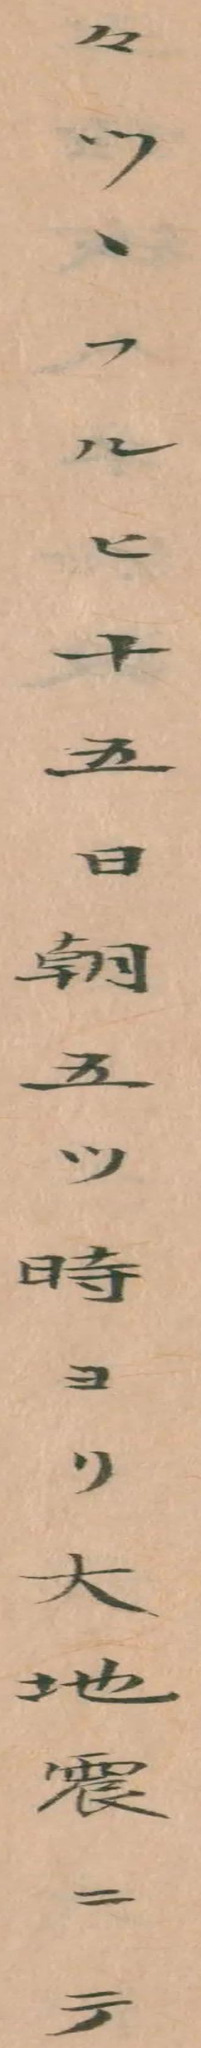々ツゝフルヒ十五日朝五ツ時ヨリ大地震ニテ
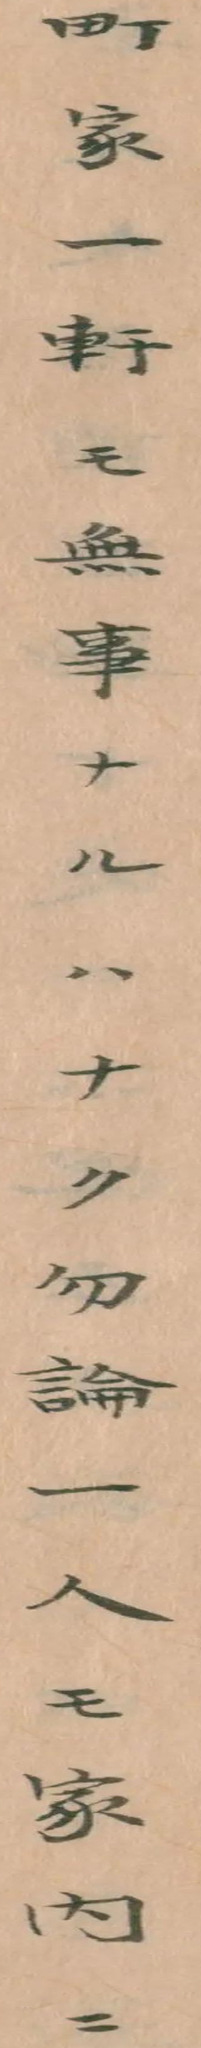町家一軒モ無事ナルハナク勿論一人モ家内二
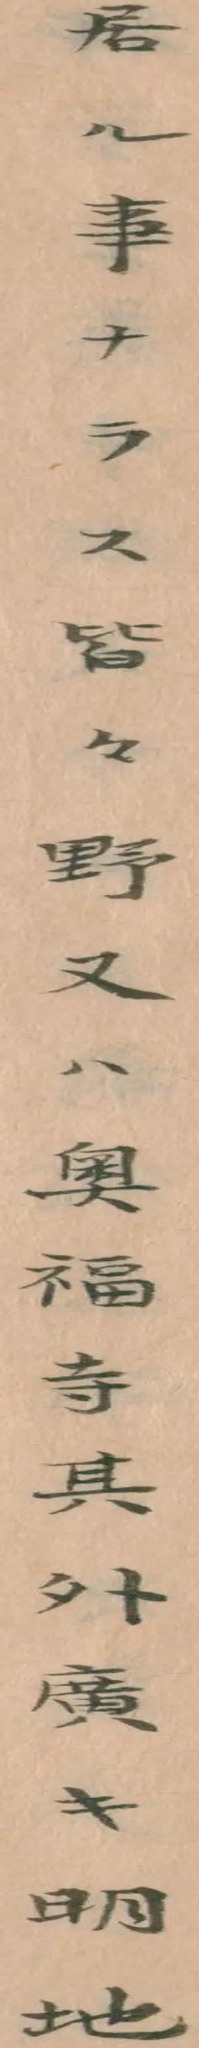居ㇽ事ナラス皆々野又ハ興福寺其外広キ明地
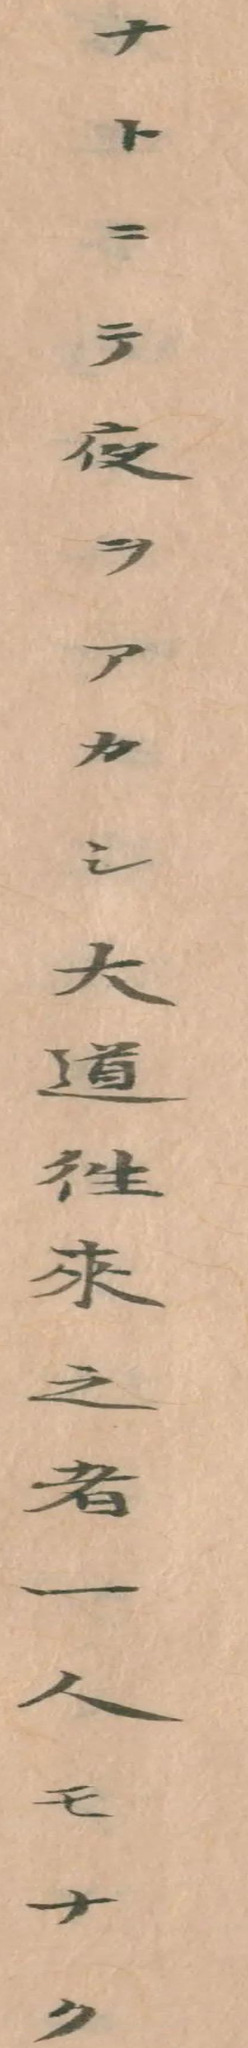ナトニテ夜ヲアカシ大道往来之者一人モナク
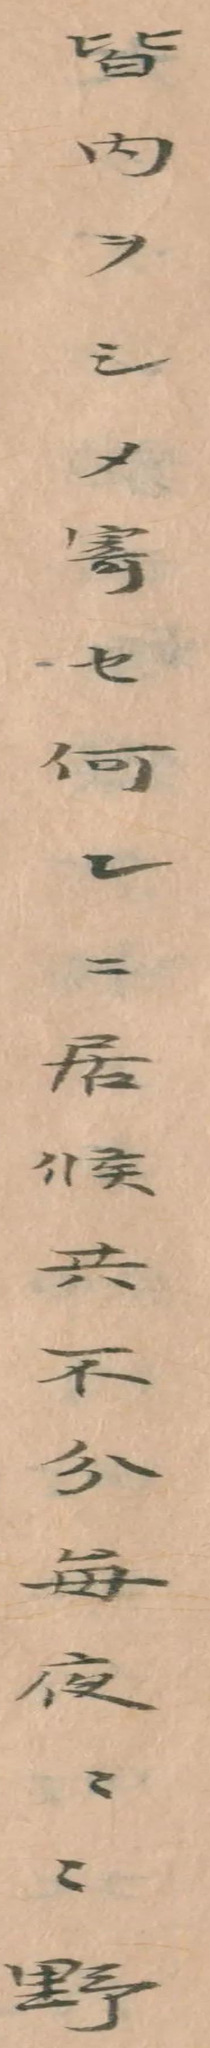皆内ヲシメ寄セ何レ二居候共不毎分夜々々野
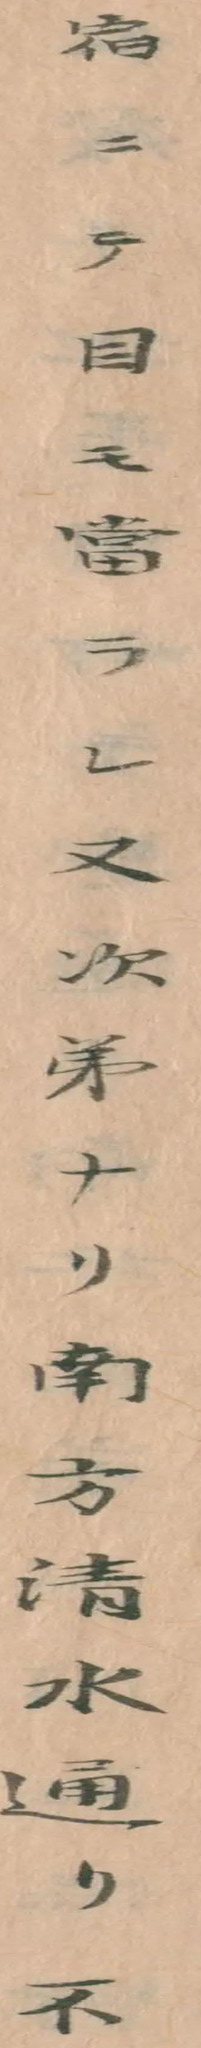宿ニテ目モ当ラレヌ次第ナリ南方清水通り不
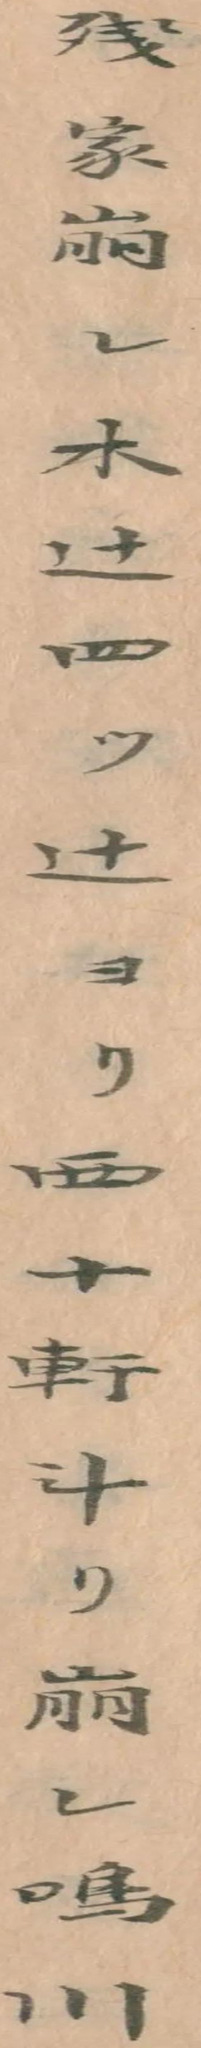残家崩レ木辻四ッ辻ヨリ西十軒斗り崩レ鳴川

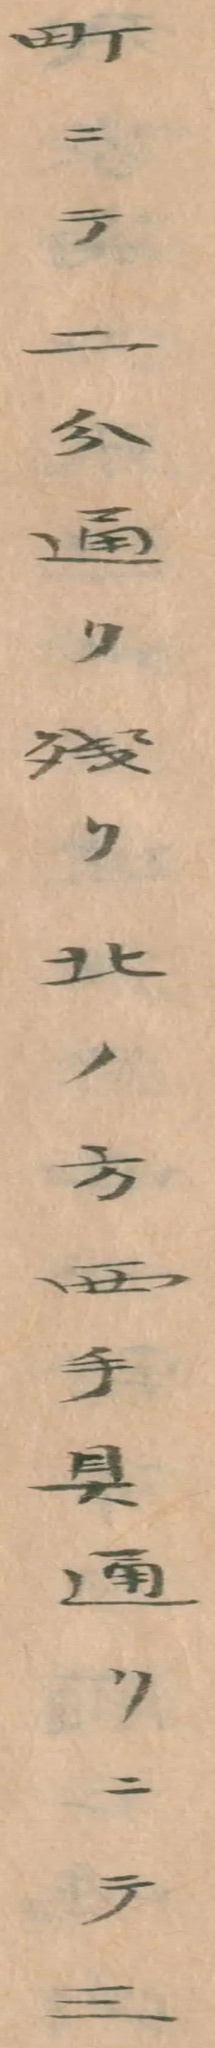町ニテ二分通り残リ北ノ方西手具通りニテ三
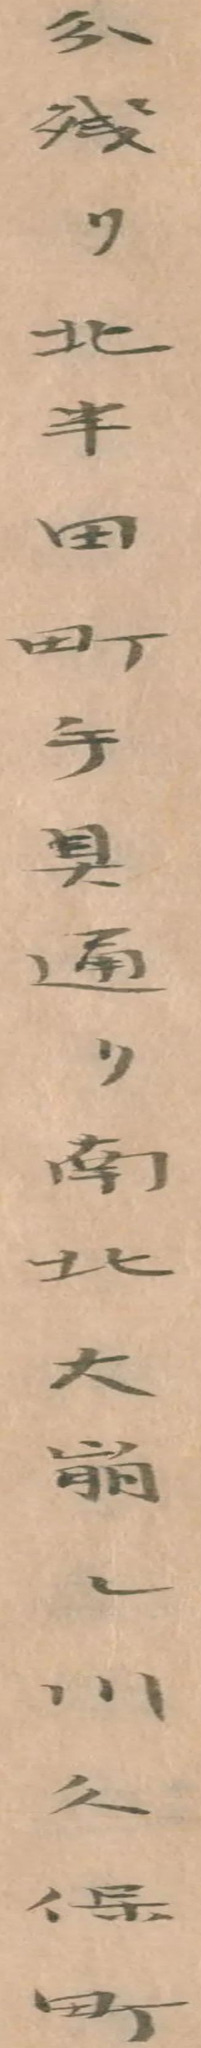分残り北半田町手具通り南北大崩レ川久保町
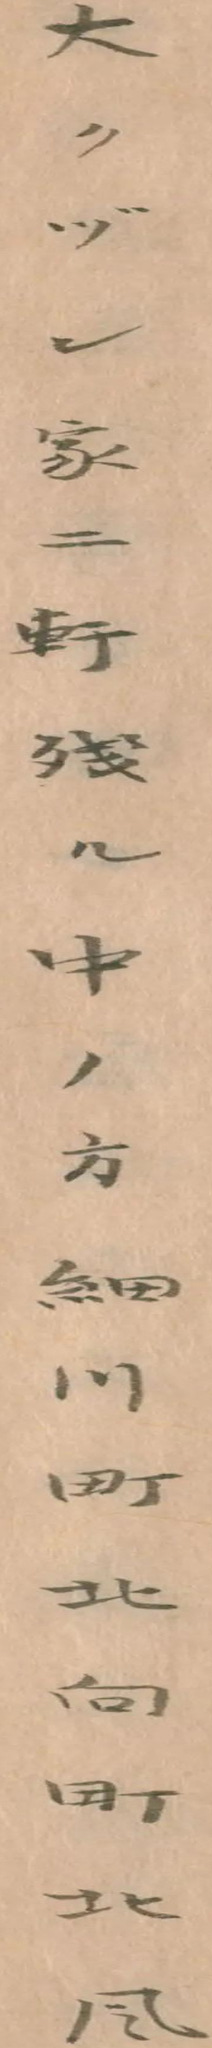大クズレ家二軒残ル中ノ方細川町北向町北風
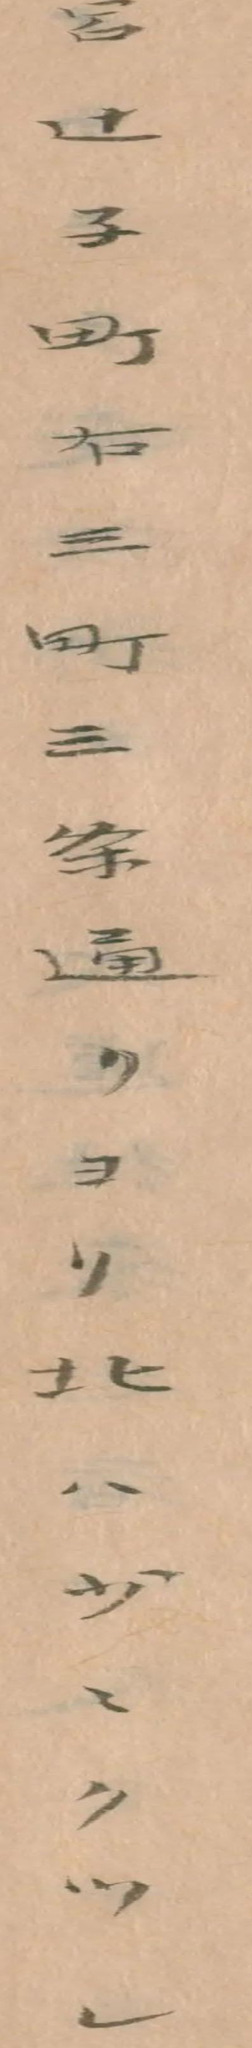呂辻子町右三町三条通りヨリ北ハ少々クツレ
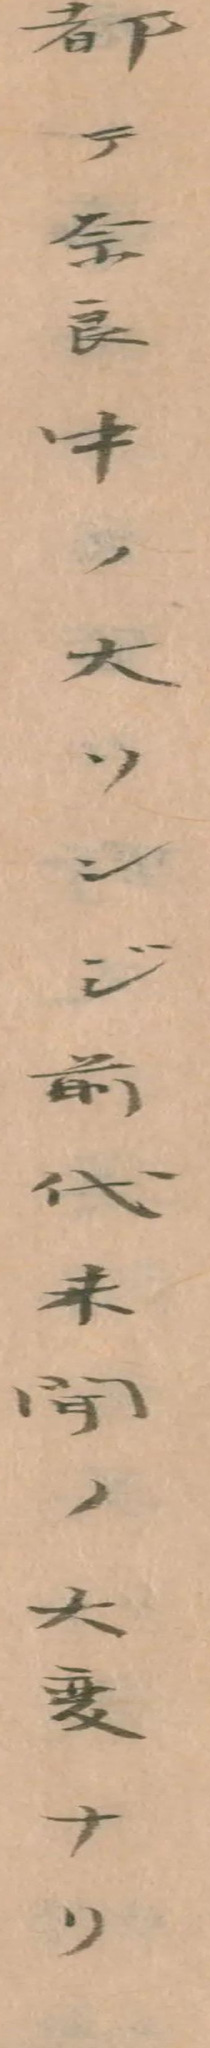都テ奈良中ノ大ソンジ前代未聞ノ大変ナリ
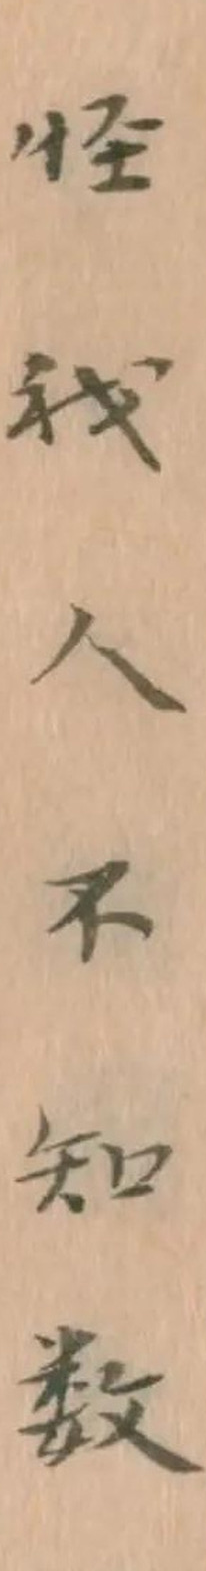怪我人不知数
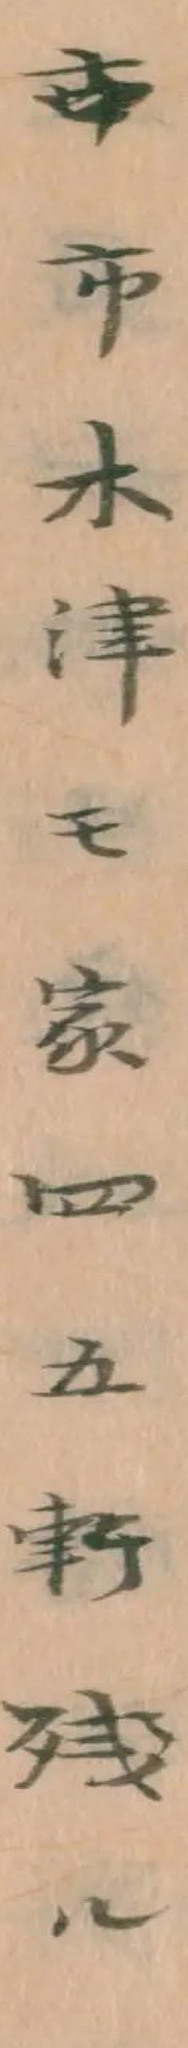古市木津モ家四五軒残ル
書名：地災撮要. 巻1(噴火山・地震ノ部)
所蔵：国立国会図書館 National Diet Library, JAPAN
